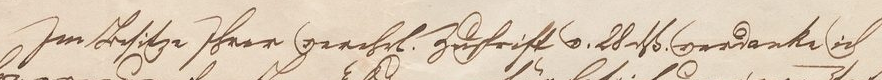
Im Besitze Ihrer verehrl. Zuschrift v. 28 dß. verdanke ich
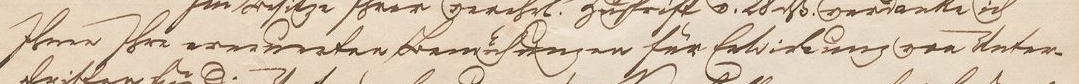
Ihnen Ihre erneuerten Bemühungen für Erwirkung von Unter-
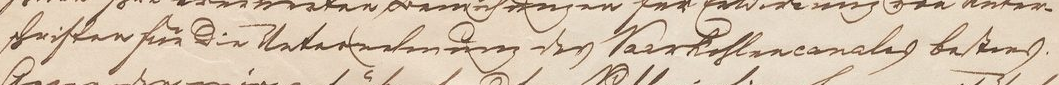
schriften für die Unternehmung des Saarkohlencanales bestens.
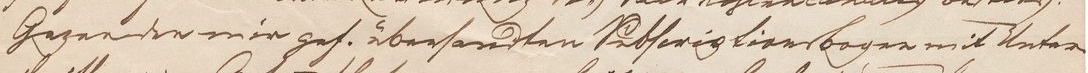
Gegen den mir gef. übersandten Subscriptionsbogen mit Unter-
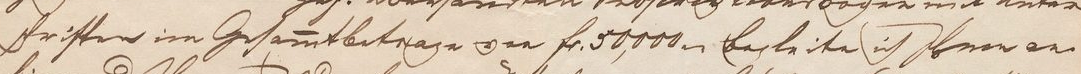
schriften im Gesammtbetrag von fr. 50,000.– begleite ich Ihnen an-
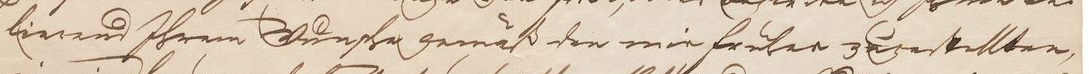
liegend Ihrem Wunsche gemäß den mir früher zugestellten,
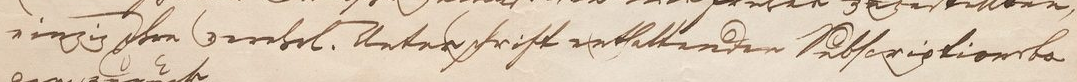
einzig Ihre verehrl. Unterschrift enthaltenden Subscriptionsbo-
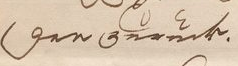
gen zurück.
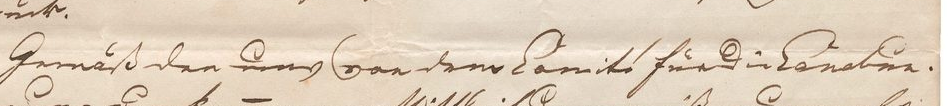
Gemäß den uns von dem Comité für die Canalun-
